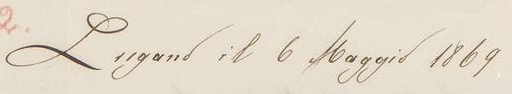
Lugano il 6 Maggio 1869
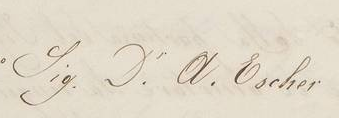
Sig. Dr A. Escher
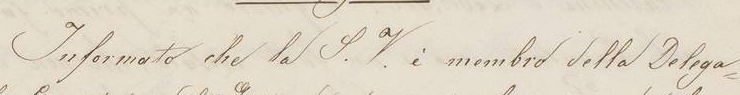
Informato che la S. V. è membro della Delega-
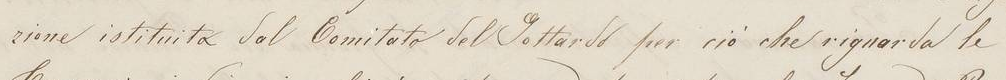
zione istituita dal Comitato del Gottardo per ciò che riguarda le
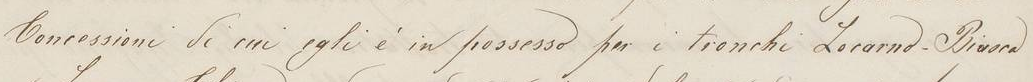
Concessione di cui egli è in possesso per i tronchi Locarno–Biasca
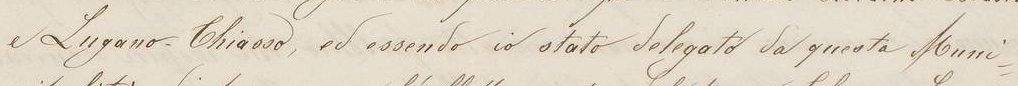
e Lugano–Chiasso, ed essendo io stato delegato da questa Muni-
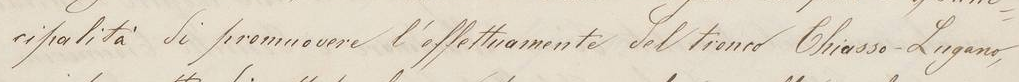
cipalità di promuovere l'effettuamente del tronco Chiasso–Lugano,
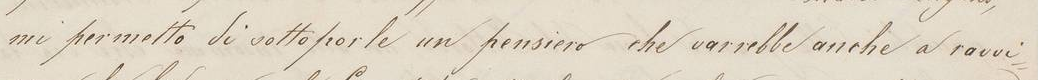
mi permetto di sottoporle un pensiero che varrebbe anche a ravvi-
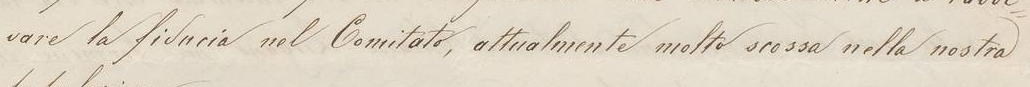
vare la fiducia nel Comitato, attualmente molto scossa nella nostra
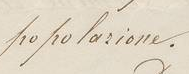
popolazione.
